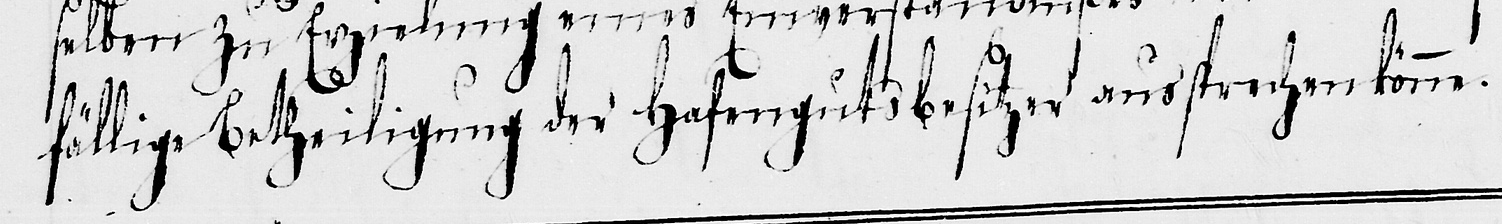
fällige Betheiligung der Hafengutsbesitzer aussprechen könne.
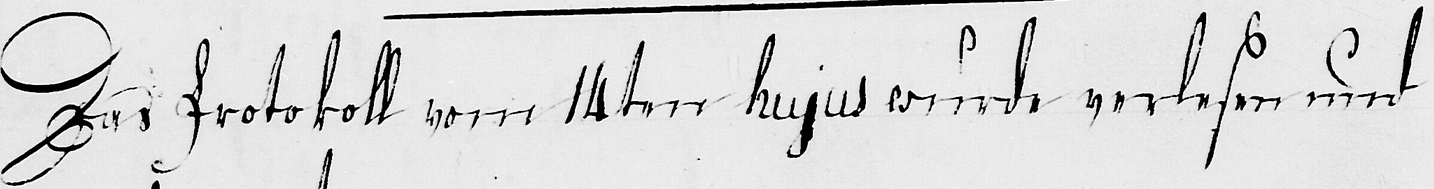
Das Protokoll vom 14ten hujus wurde verlesen und
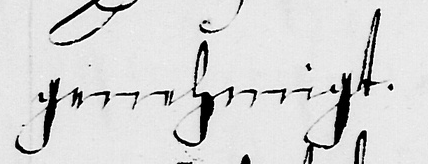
genehmigt.
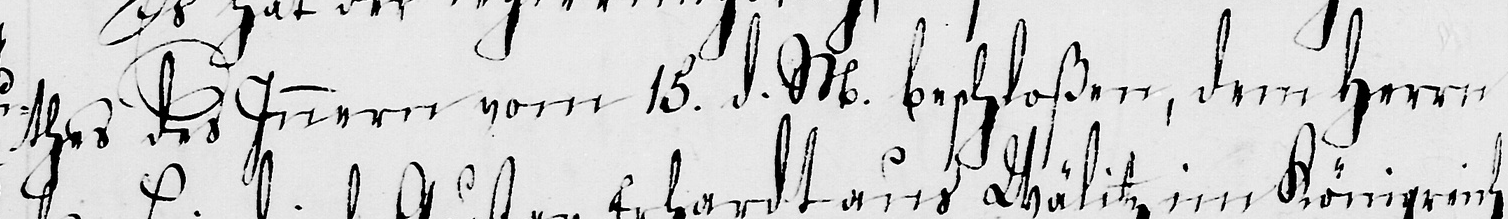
thes des Innern vom 15. d. M. beschloßen, dem Herrn
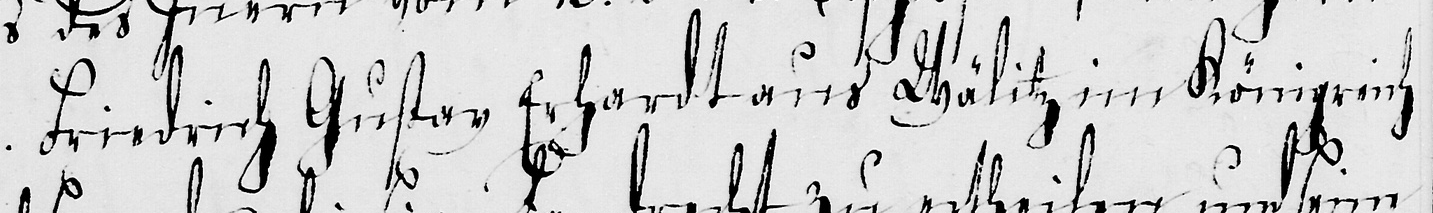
Friedrich Gustav Erhardt aus Wälitz im Königreich
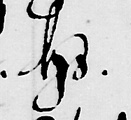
Hs.
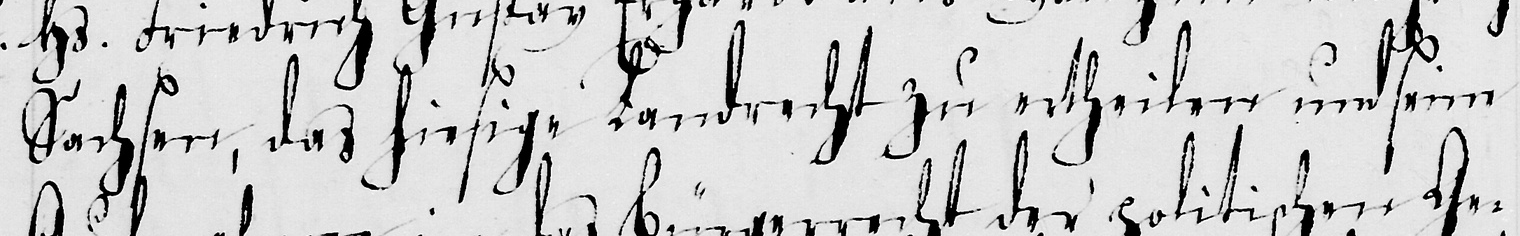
Sachsen, das hiesige Landrecht zu ertheilen und seine
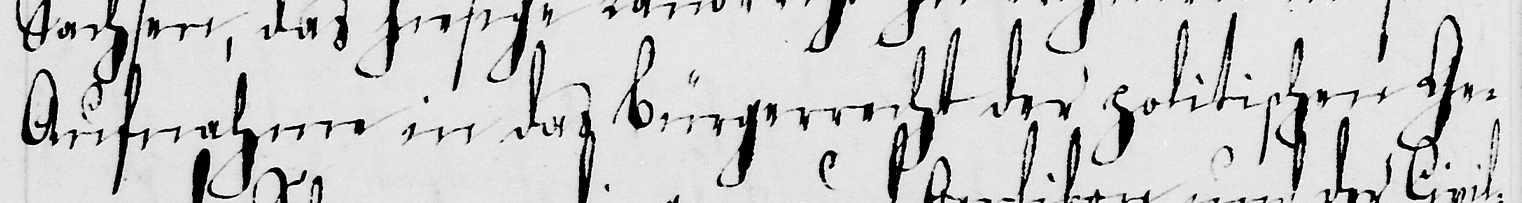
Aufnahme in das Bürgerrecht der politischen Ge¬
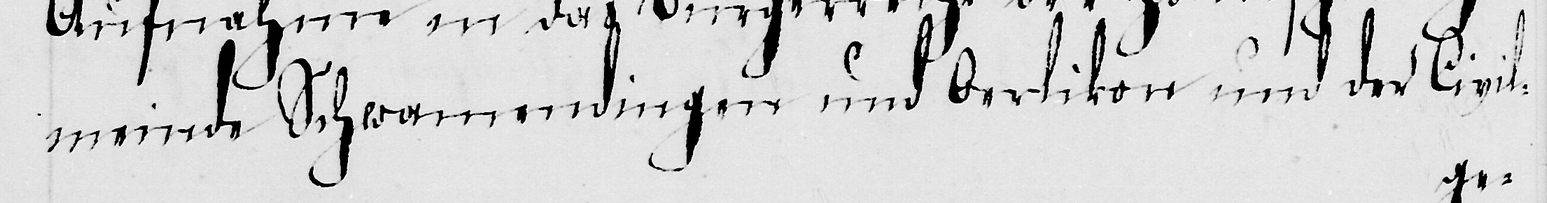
meinde Schwamendingen und Oerlikon und der Civil-
